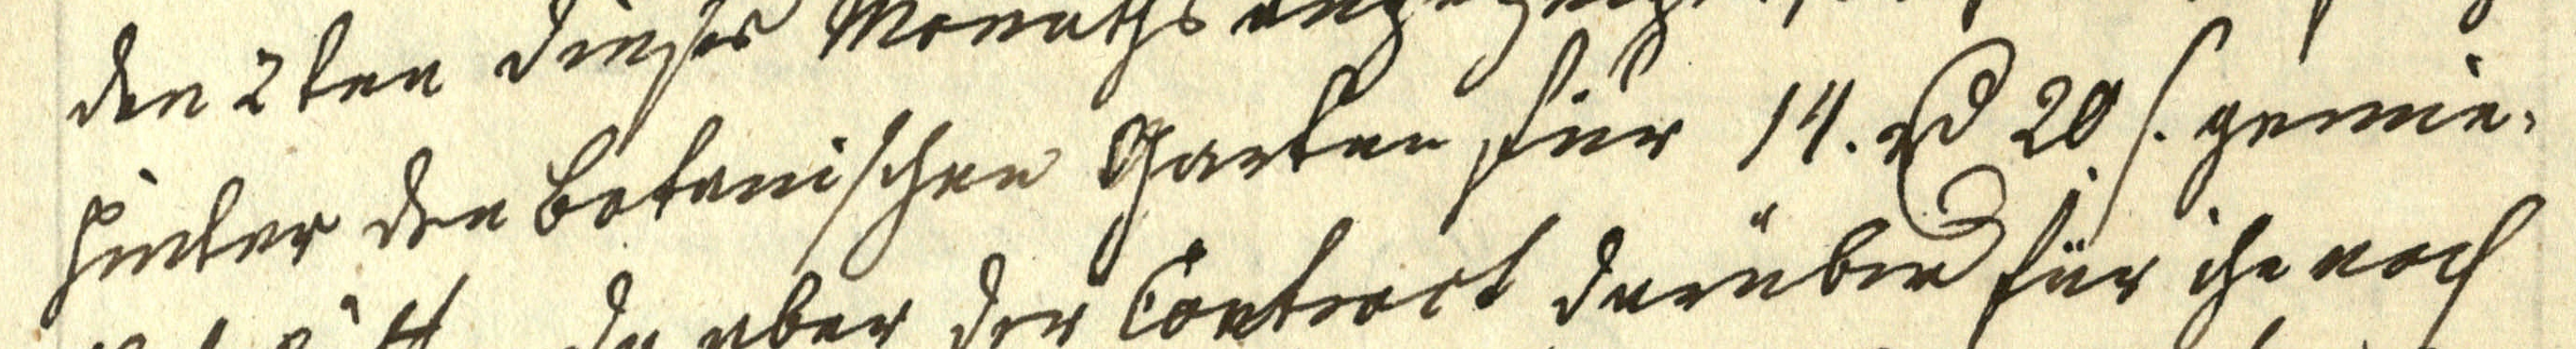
hinter den Botanischen Garten er 14. rt. 20. s gemie¬
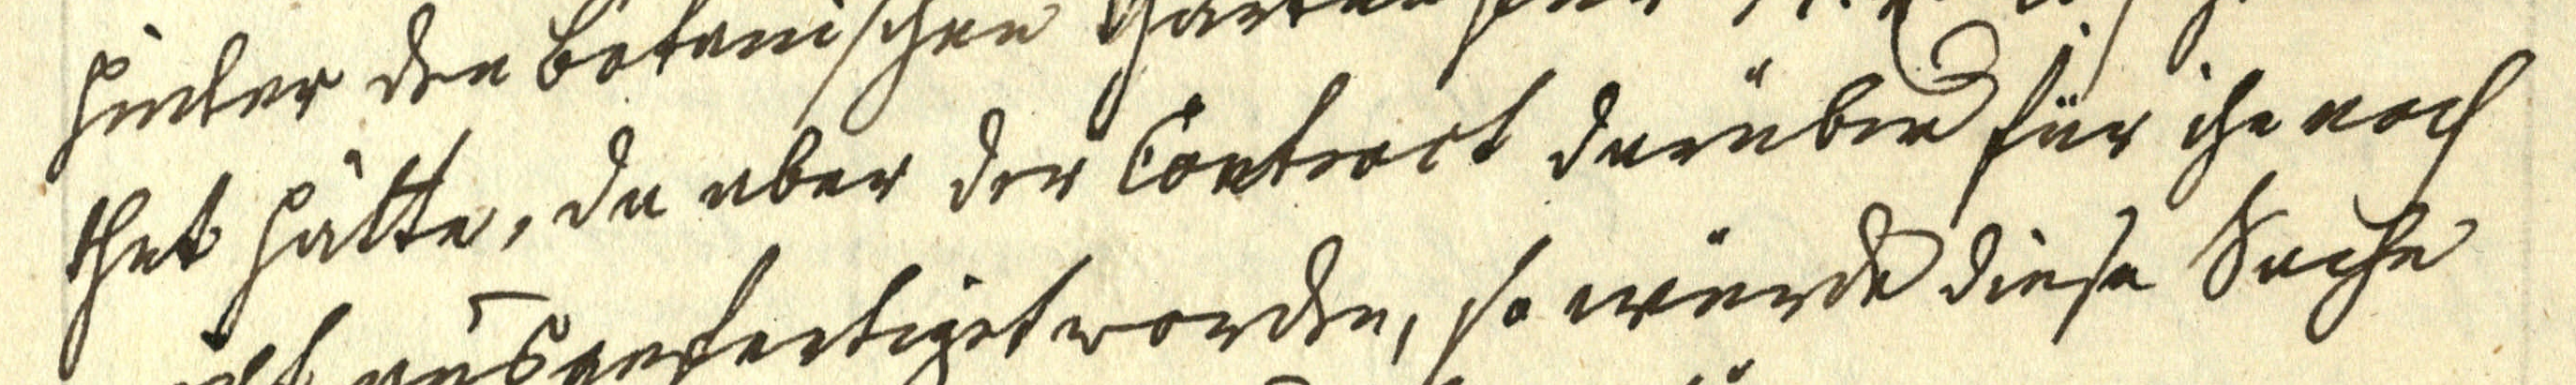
thet hätte, da aber der Contract darüber für ihn noch
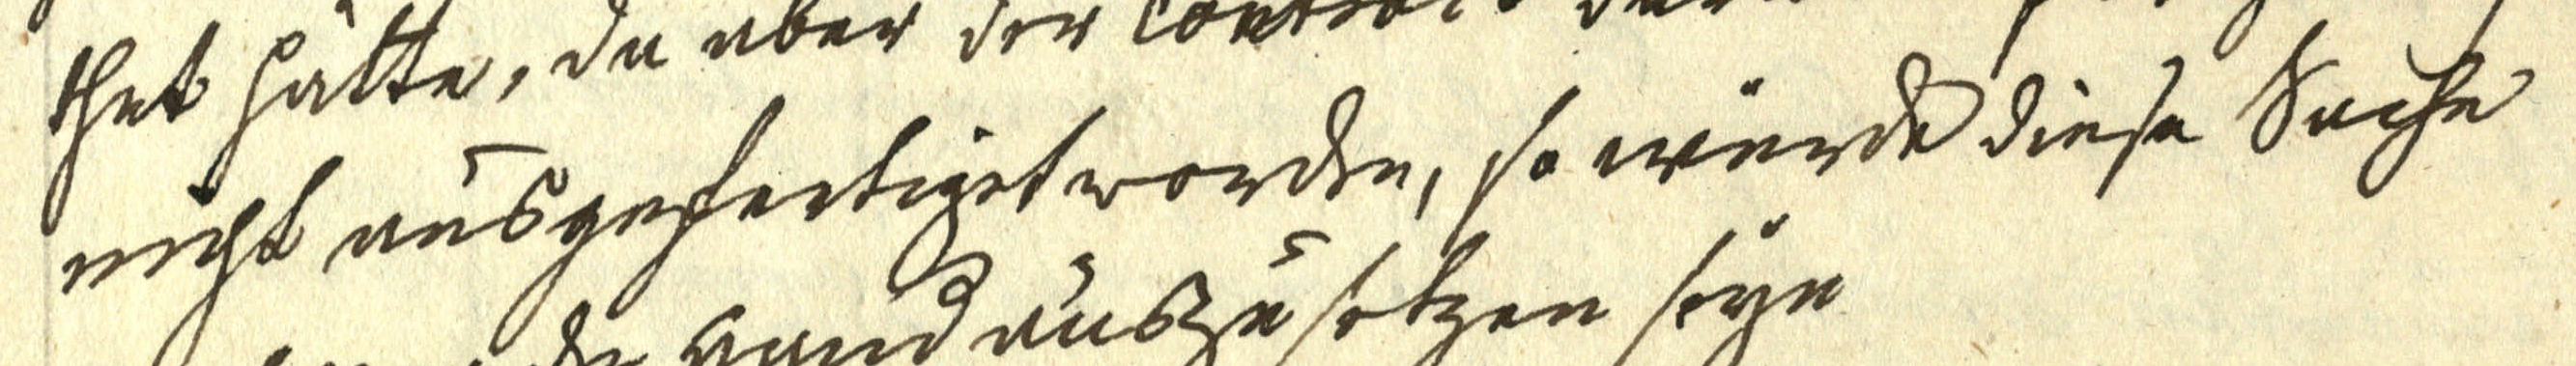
nicht ausgefertiget worden, so würde diese Sache
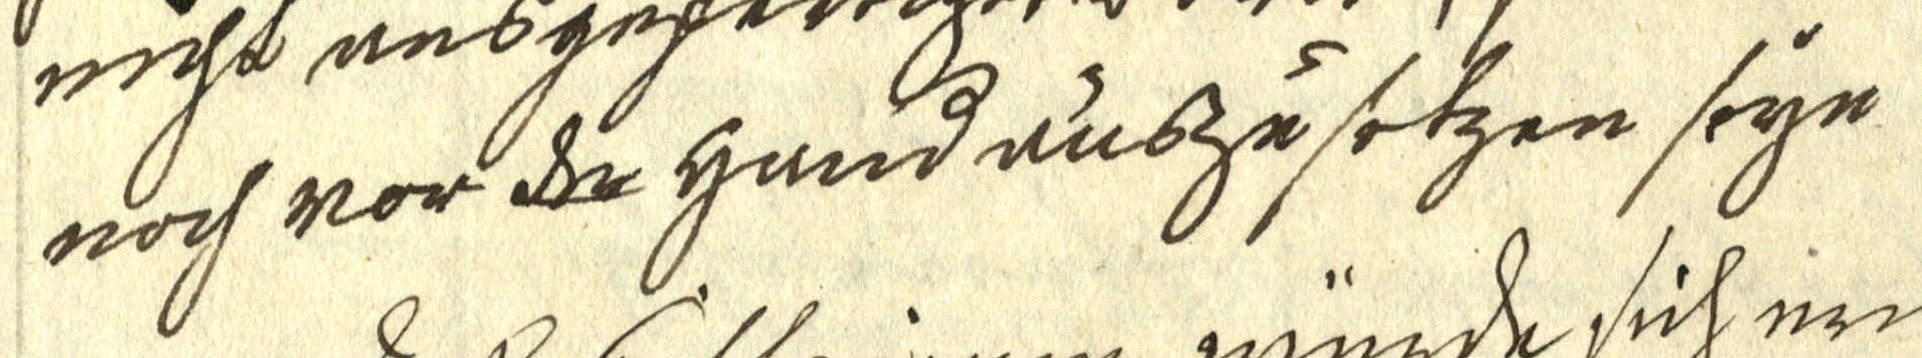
noch vor der Hand auszusetzen seÿn.
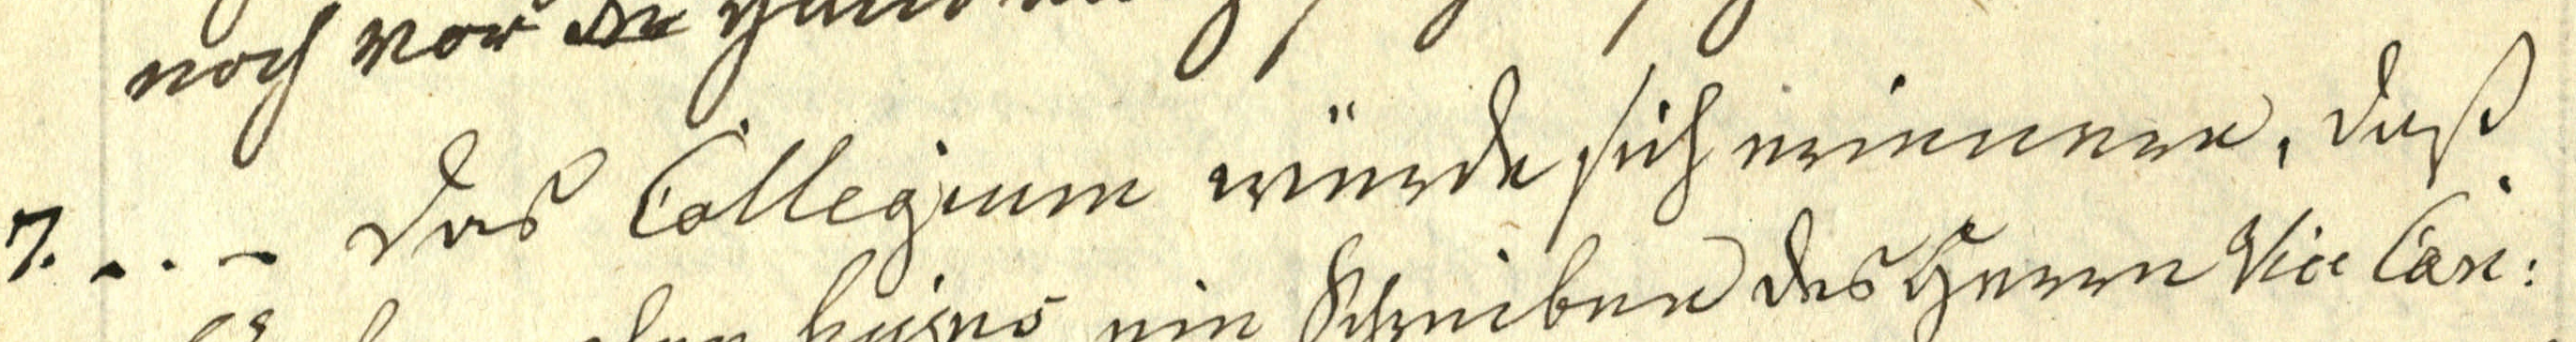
7. Das Collegium würde sich erinnern, daß
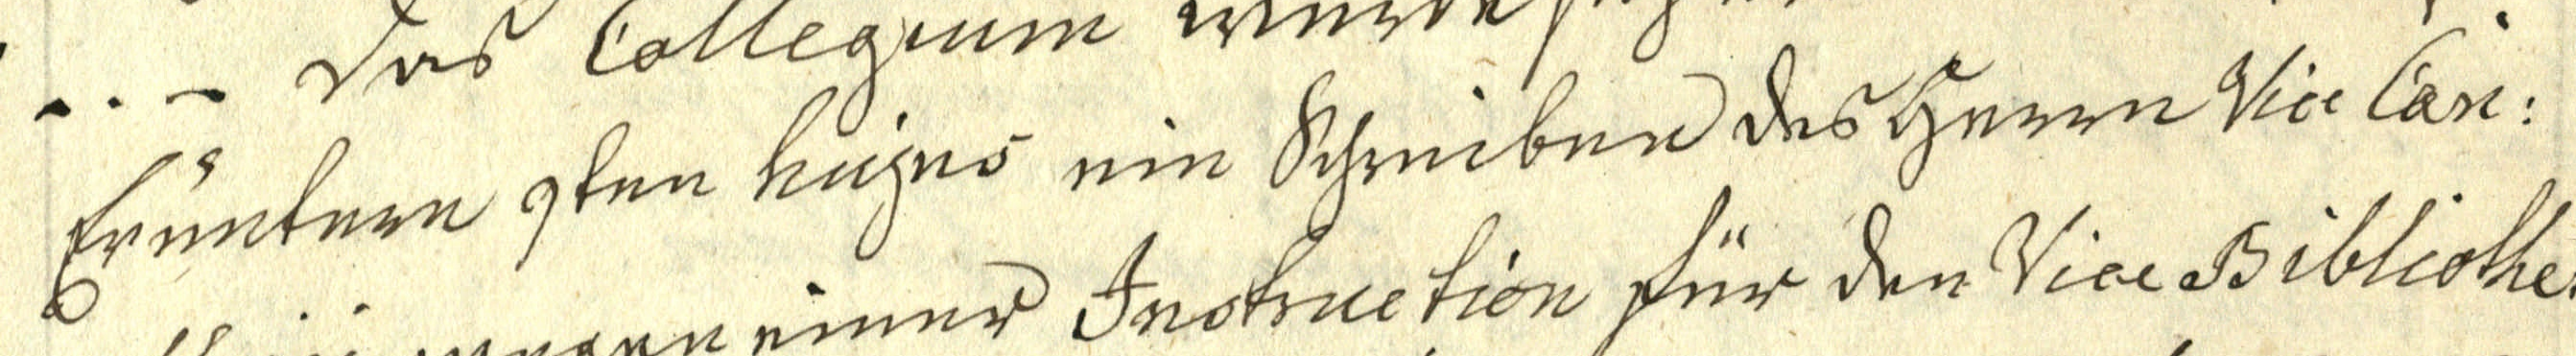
Er unterm 9 ten hujus ein Schreiben des Herrn Vice Can¬
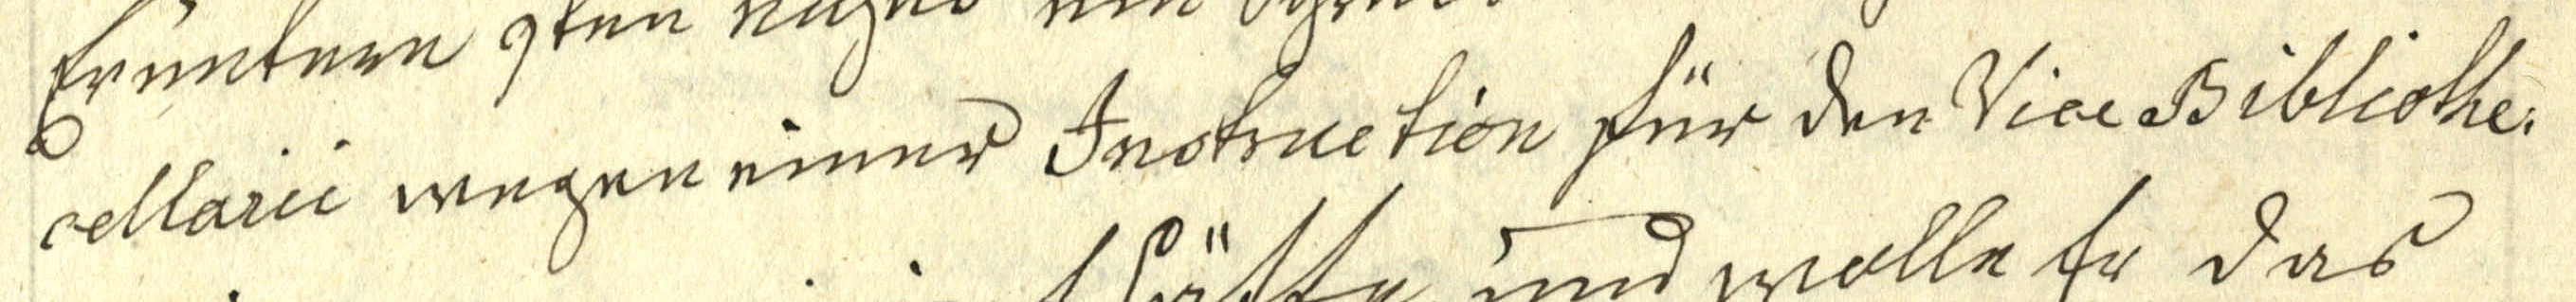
cellarii wegen einer Instruction für den Vice Bibliothe¬
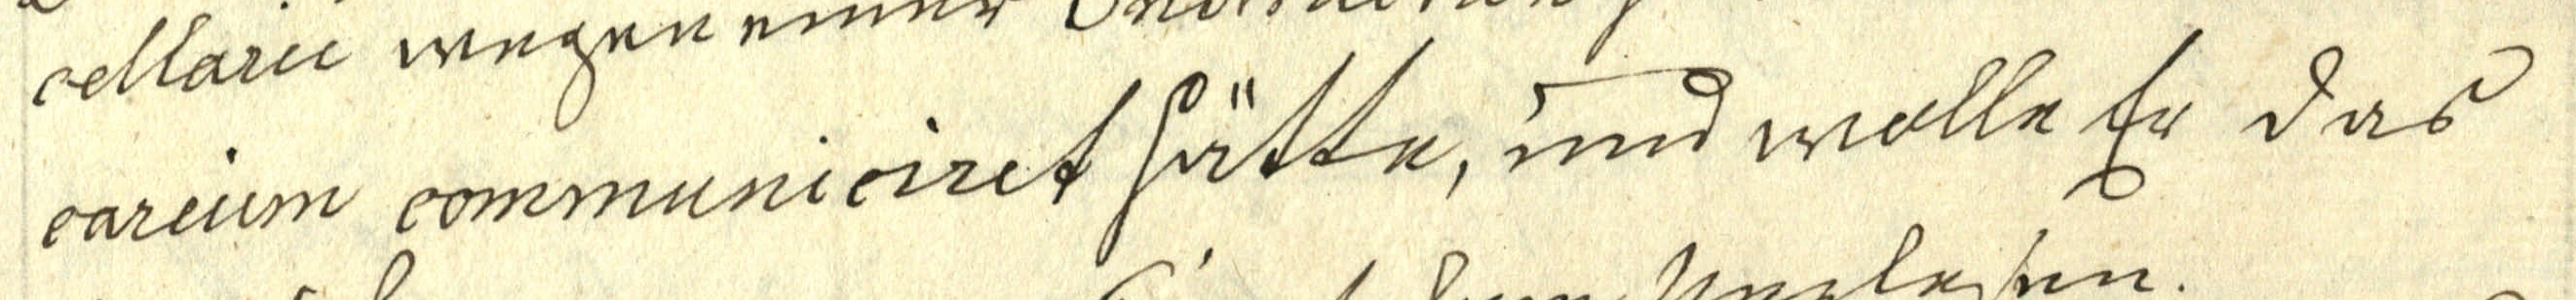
carium communiciret hätten, und wolle Er das
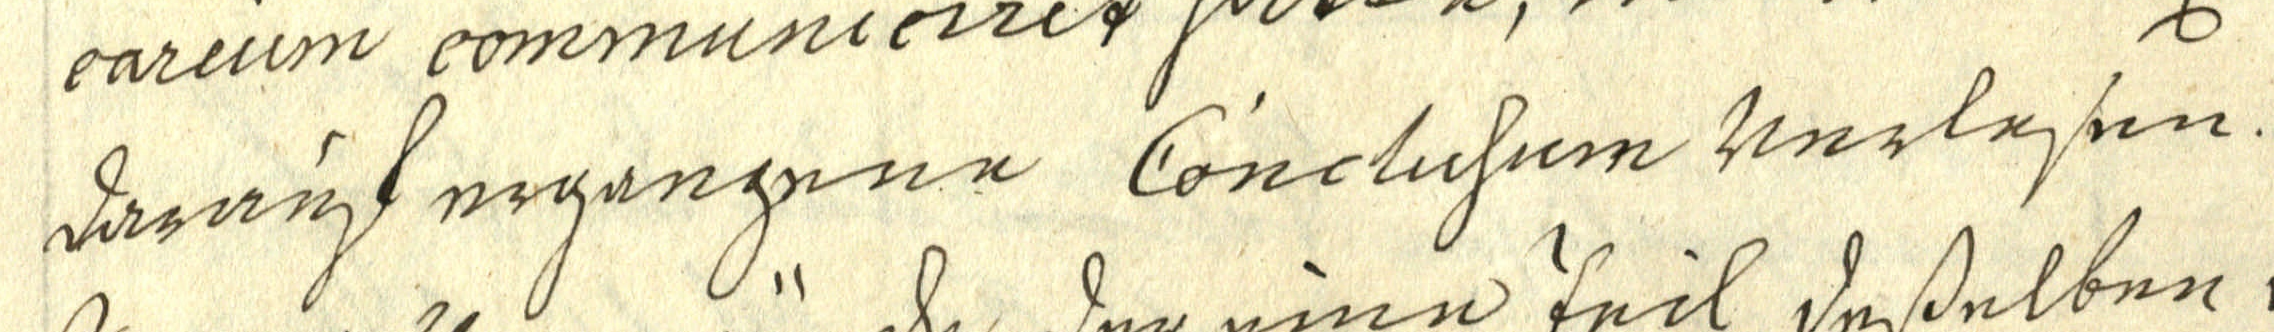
darauf ergangene Conclusum verlesen.
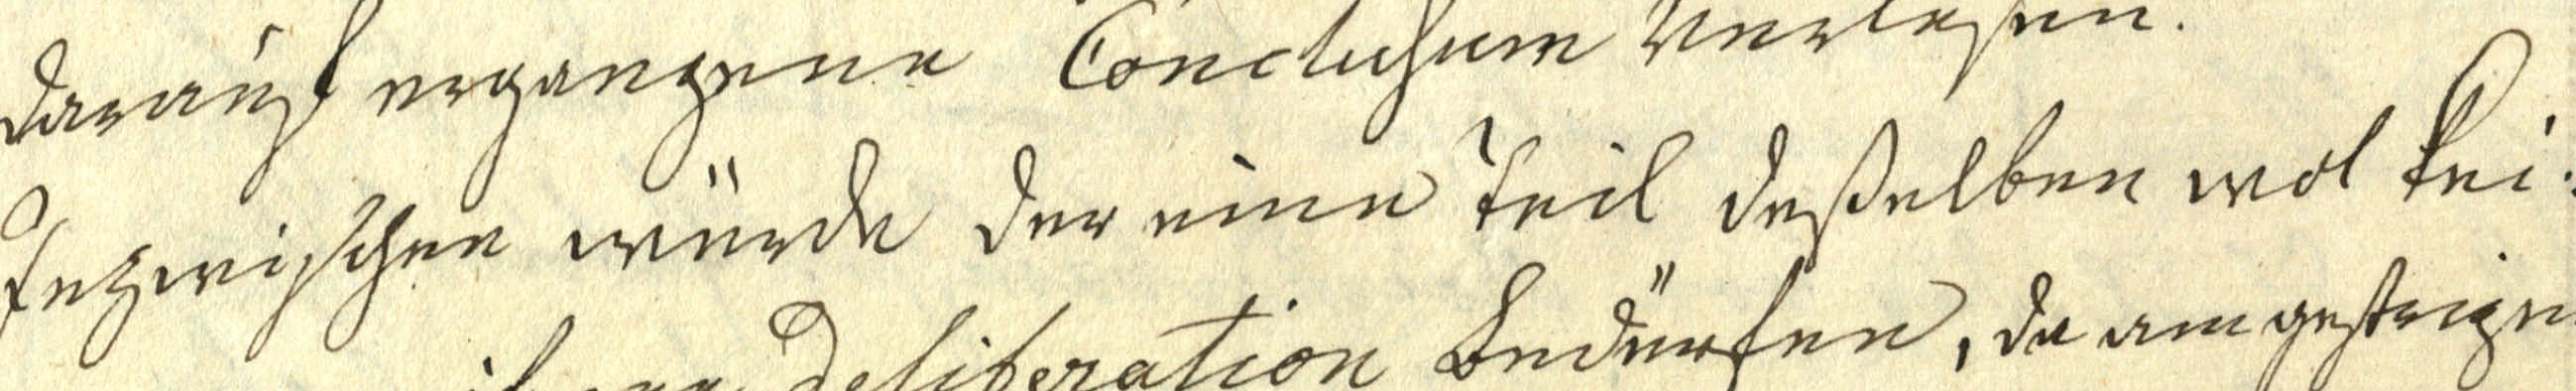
Inzwischen würde der eine Teil deßelben wol kei¬
